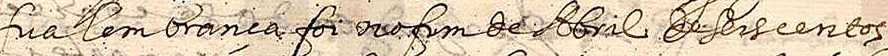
sua lembrança foi no fim de Abril de seiscentos
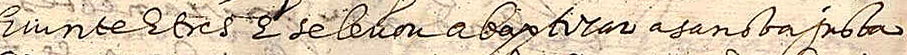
E uinte E tres E se leuou a baptizar a sancta justa
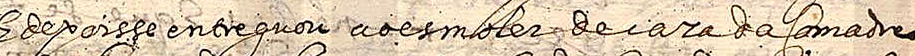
E depois se entreguou ao esmoler de caza da Comadre
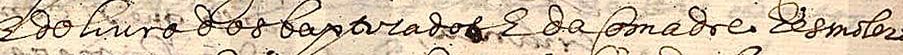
E do liuro dos baptizados E da Comadre E esmoler
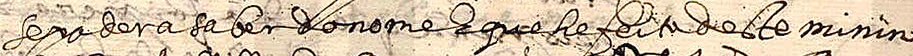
se podera saber do nome E que he feito deste minino
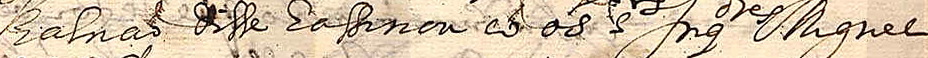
E al naõ disse E assinou cō os sres Jnqdres Miguel
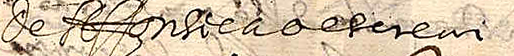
de Affonseca o escreui
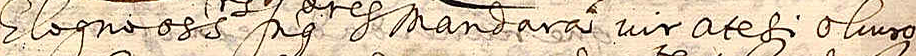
E loguo os sres Jnqdres Mandaraõ uir ate si o liuro
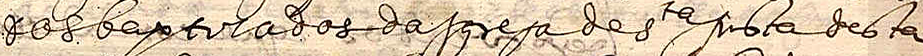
dos baptizados da Jgreja de sta Justa desta
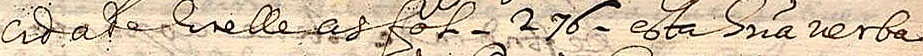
cidade E nelle as fol - 276 - esta huā uerba
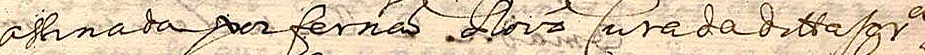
assinada por fernaõ Roiz̄ Cura da ditta Jgra
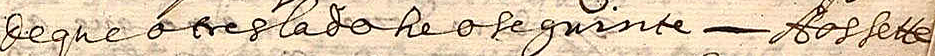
de que o treslado he o seguinte –– Aos sette
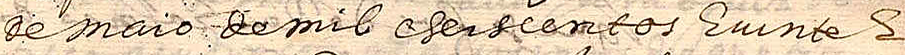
de maio de mil e seiscentos E uinte E
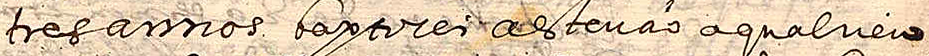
tres annos baptizei a esteuaõ o qual ueio
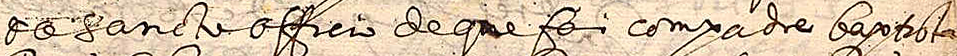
do sancto officio de que foi compadre baptista
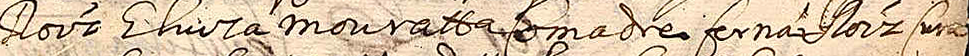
Roiz̄ E luiza mouratta Comadre fernaõ Roiz̄ Cura
